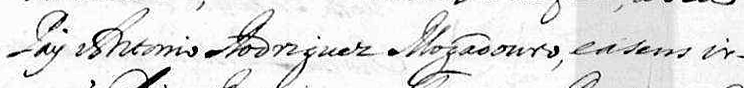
Pay Antonio Rodriguez Mogadouro, e a seus ir
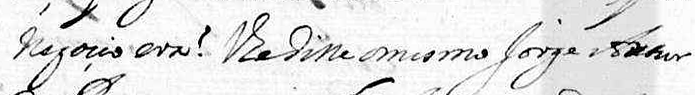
negocio era? lhe disse o mesmo Jorge Artur
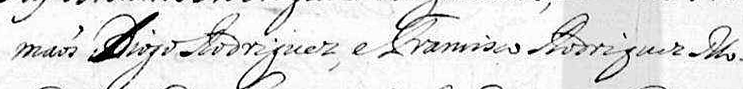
maõs Diogo Rodriguez, e Francisco Rodriguez Mo
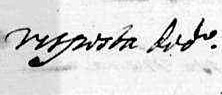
resposta do do.
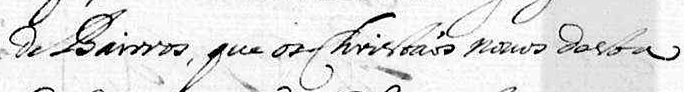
de Bairros, que os Christaõs nouos desta
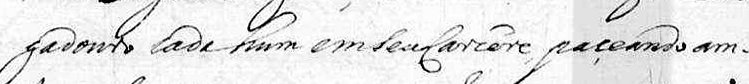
gadouro cada hum em seu Carcere paceando am
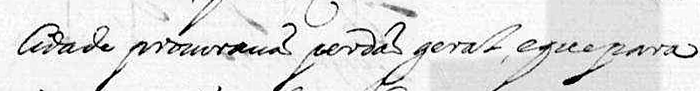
Cidade procurauaõ perdaõ geral, e que para
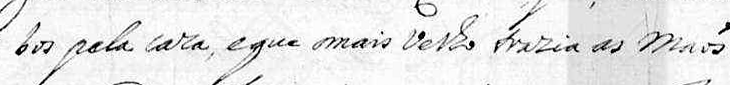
bos pela caza, e que o mais velho trazia as maõs
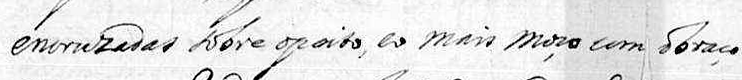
encruzadas sobre o peito, e o mais moço com o braço
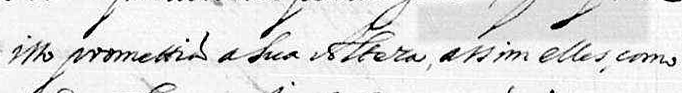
isso promettiaõ a Sua Alteza, assim elles, como
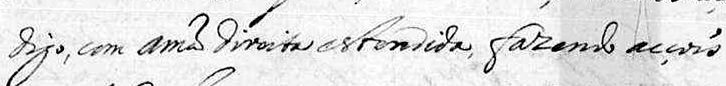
digo, com a maõ direita estendida, fazendo acçoĩs
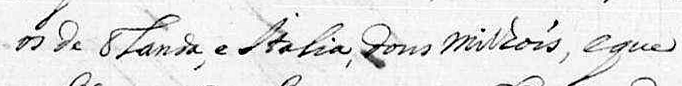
os de Olanda, e Italia, dous milhoẽs, e que
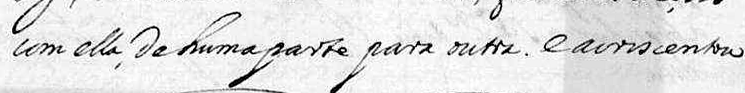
com ella, de huma parte para outra. e acrescentou
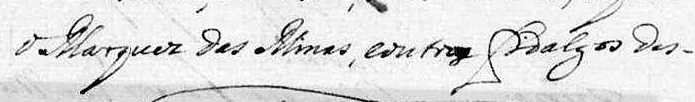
o Marquez das Minas, e outros fidalgos des
